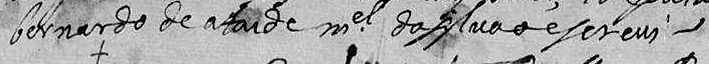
bernardo de ataide me.l da sjlua o escreui -
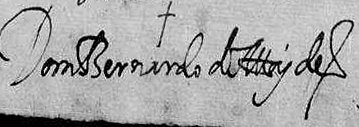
Dom Bernardo de Attajde
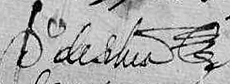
Po de silua
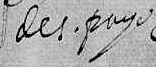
de s. payo
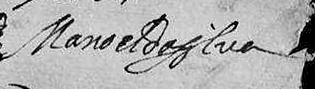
Manoel da sjlua
